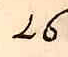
16
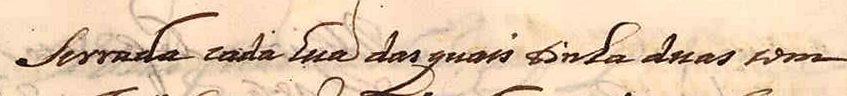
serrada cada huā das quais tinha duas com
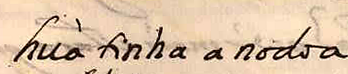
huā tinha a nodoa
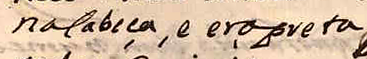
na cabeça, e era preta
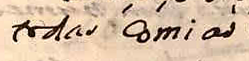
todas comiaõ
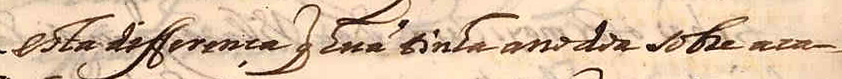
esta differença q̄ huā tinha a nodoa sobre a ca
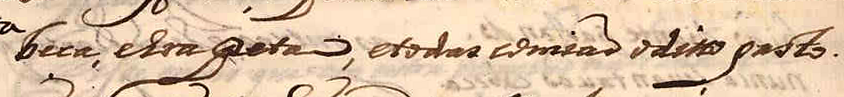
beça, e era preta, e todas comião o ditto pasto.
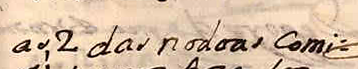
as 2 das nodoas comi
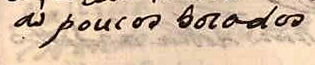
aõ poucos bocados
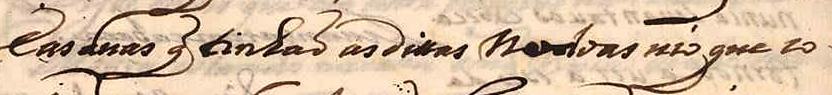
E as duas q̄ tinhaõ as dittas nodoas uio que co
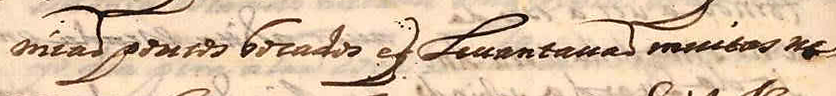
miaõ poucos bocados e q̄ Leuantauaõ muitas ue
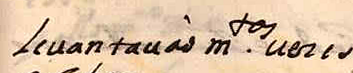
Leuantauaõ mtas uezes
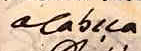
a cabeça
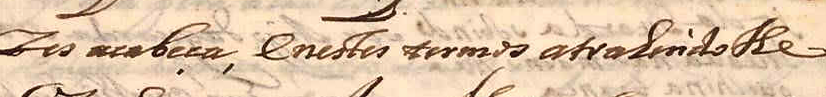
zes a cabeça, e nestes termos atrahindo lhe
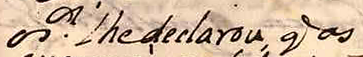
o s.or lhe declarou, q̄ as
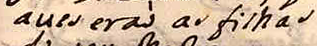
aues erão as filhas
